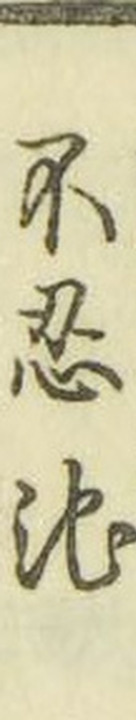不忍池
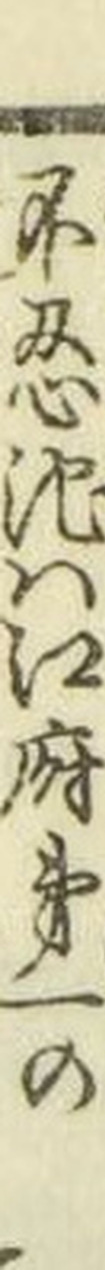不忍池は江府第一の
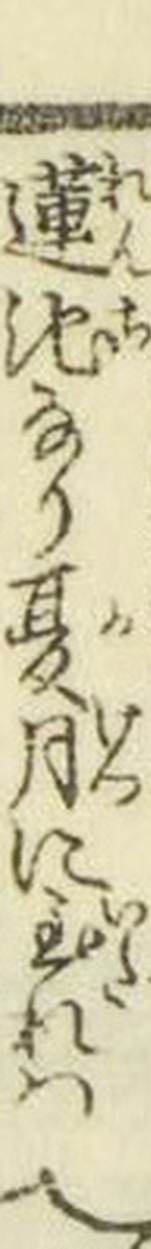蓮池なり夏月に至れは
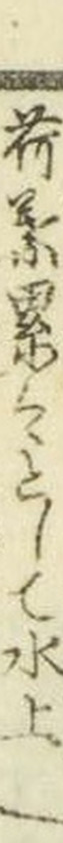荷葉累々として水上
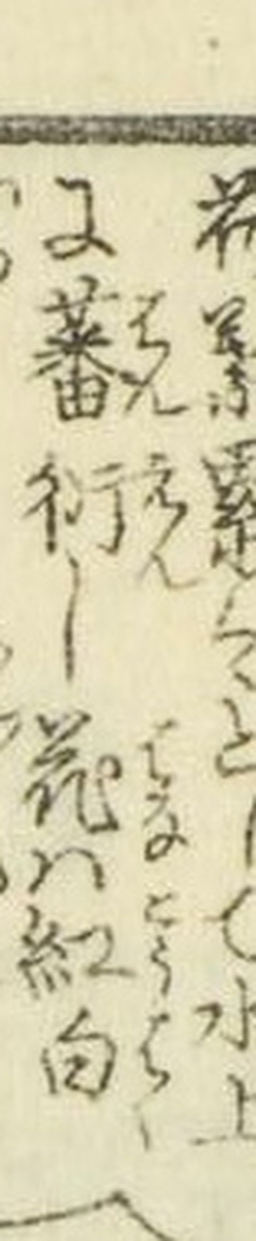に蕃衍し花は紅白
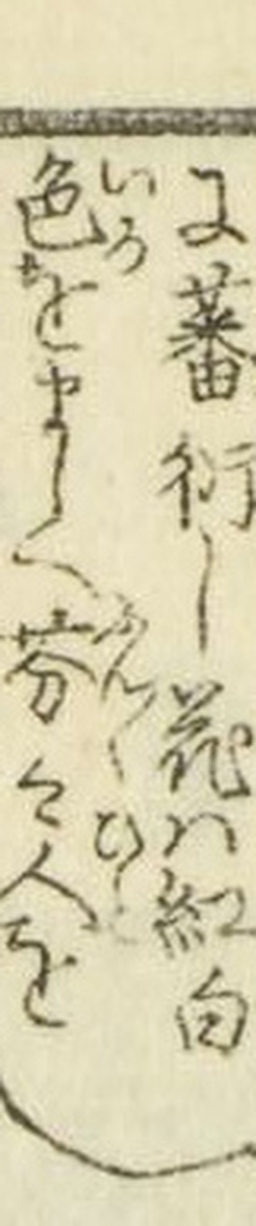色をましへ芬々人を
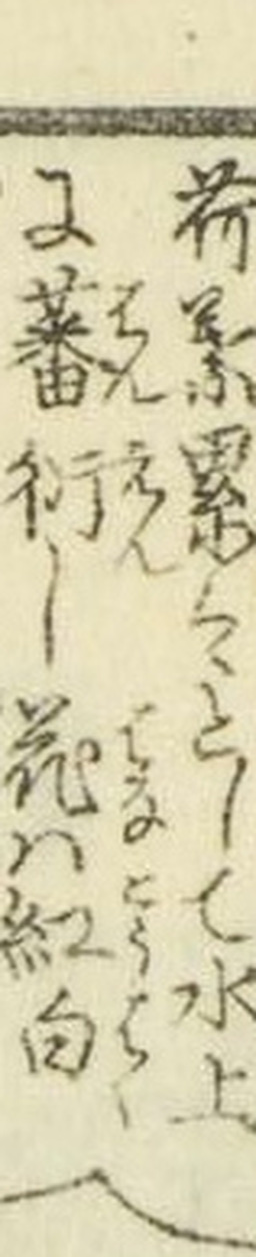に蕃衍し花は紅白
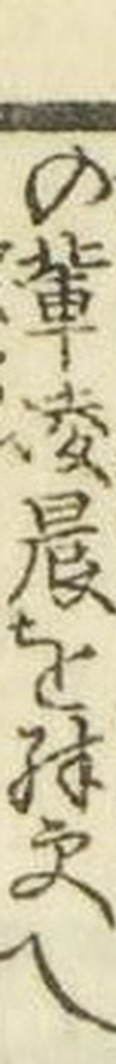の軰浚晨を殊更
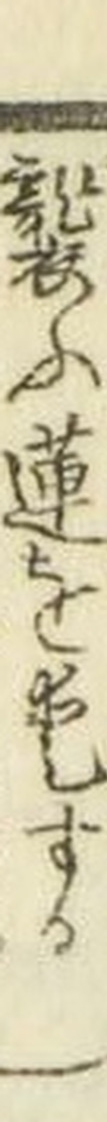襲ふ蓮を愛する
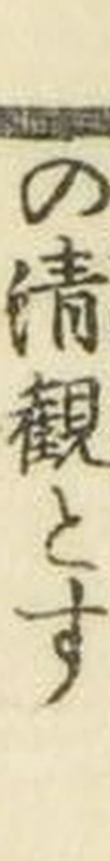の清観とす

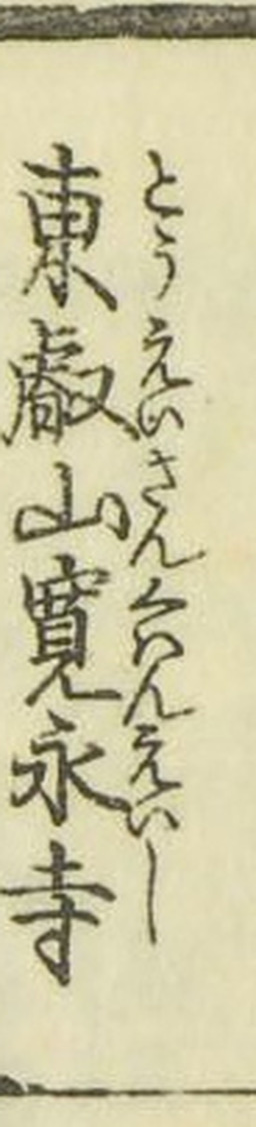東叡山寛永寺
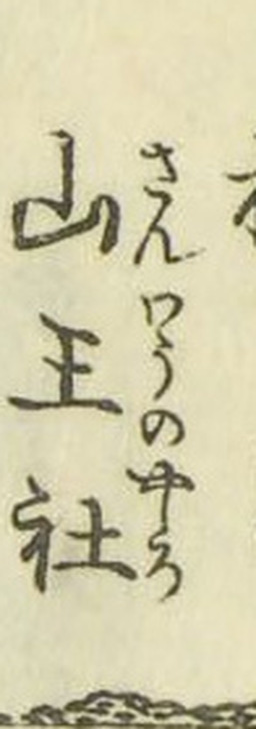山王社
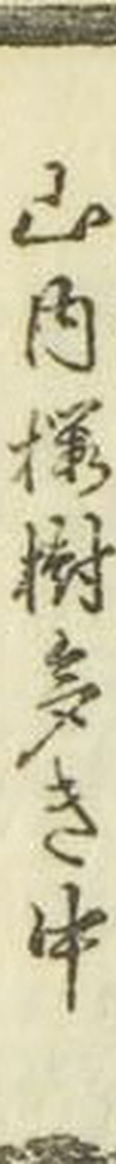山内桜樹多き中
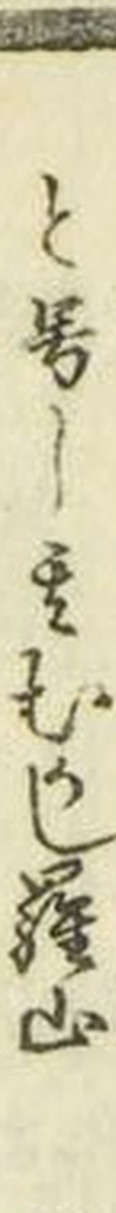と号し其むかし羅山
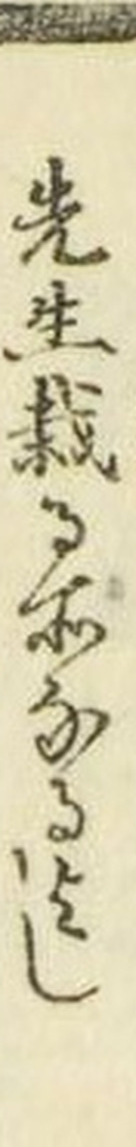先生栽る所なるよし
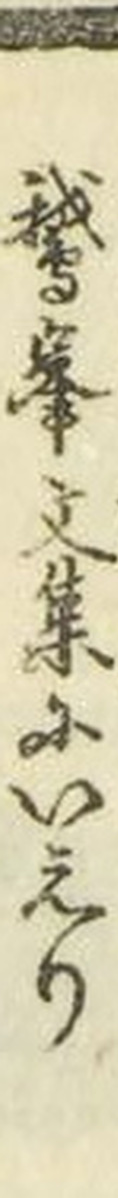鵞峯文集にいえり
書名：江戸名所図会 20巻 巻之14
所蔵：東京学芸大学教育コンテンツアーカイブ
